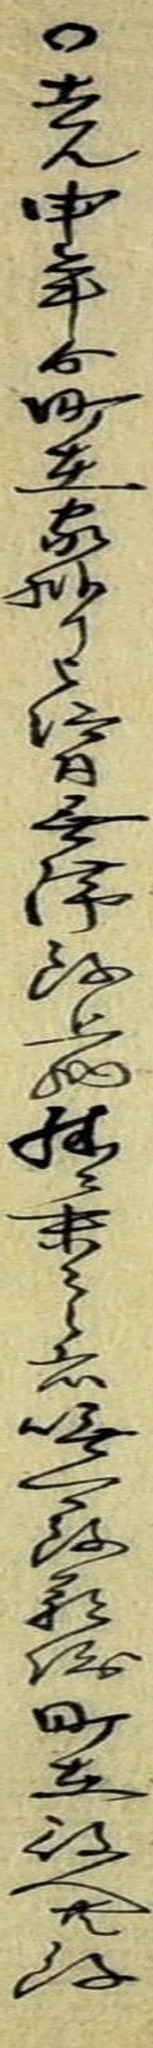〇去ル申年ゟ町在家掛り被仰付無滞致上納殊ニ末々之者嘸可致難儀町在役人共致
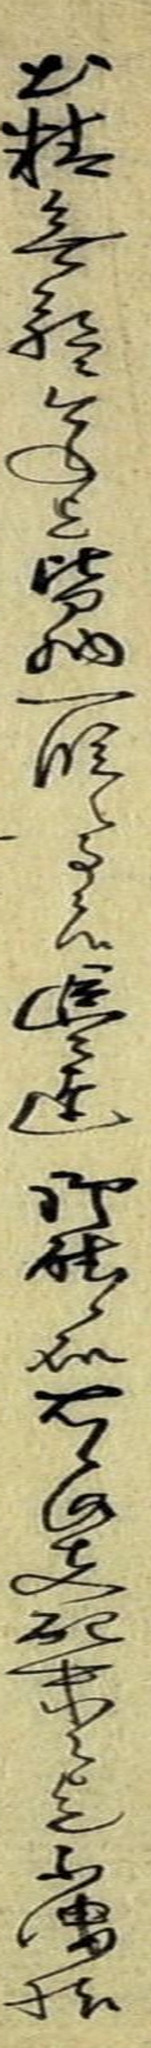出精無難ニ今年迄皆納一段之事ニ候追々達御聴候処右之趣支配末々迄不洩様
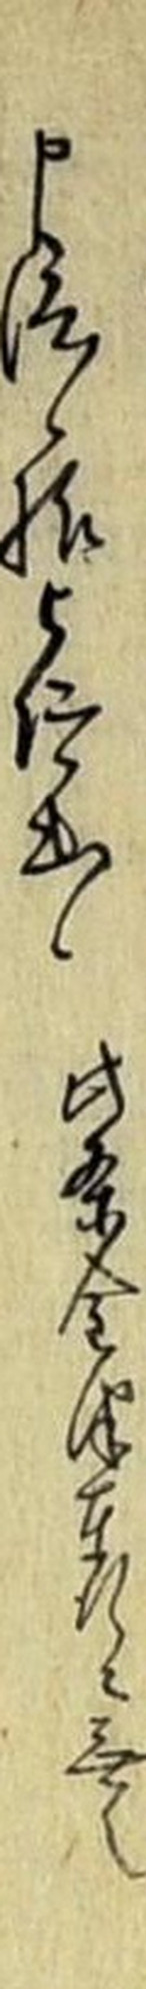申渡候様被仰出候此条金津奉行ニ無之
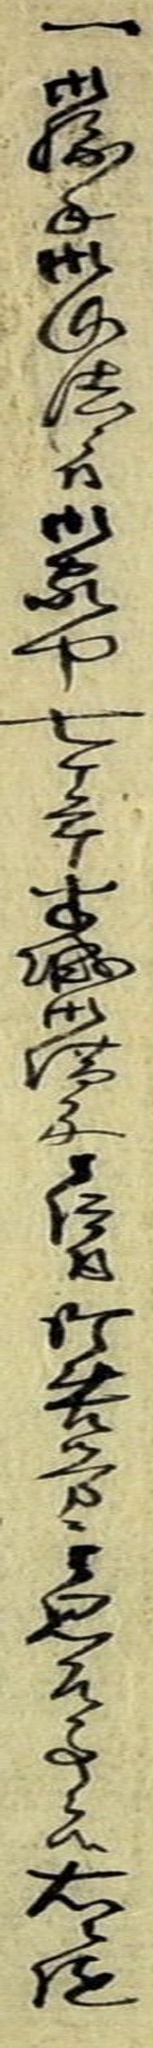一御勝手御趣法ニ付御家中七ケ年半減御借米被仰付御苦労ニ被思召事ニ候右ニ随
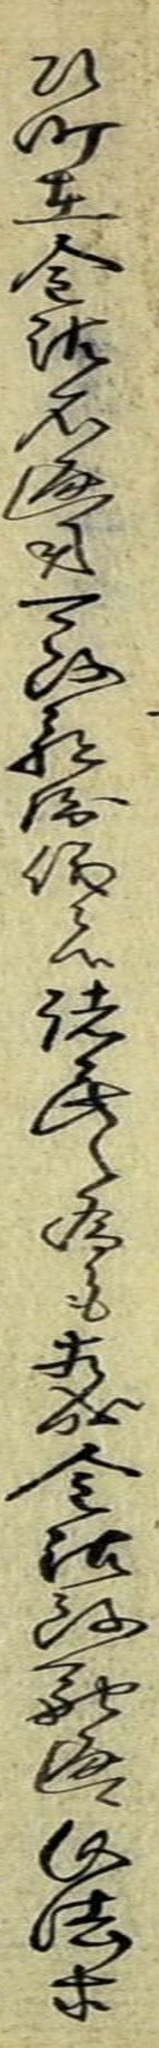ひ町在金銀不通用可致難儀ニ候諸民之為ニも相成金銀致馳通候趣法等
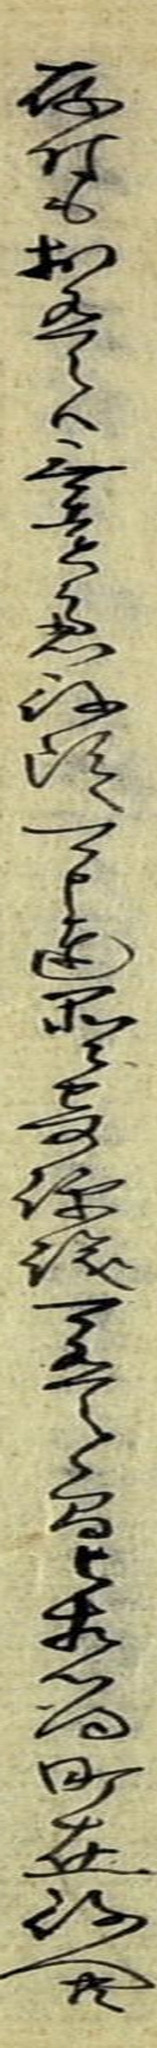存付も於有之ハ無遠慮役頭へ可申達品ニ寄評議可有之候間被相心得町在役人共
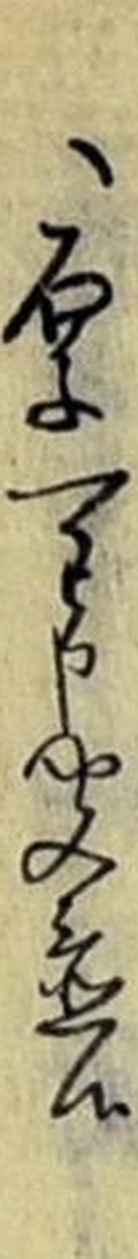へ厚可被申聞置候
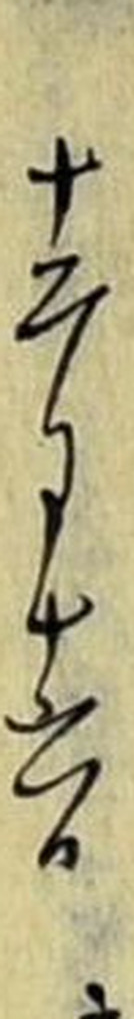十二月十三日
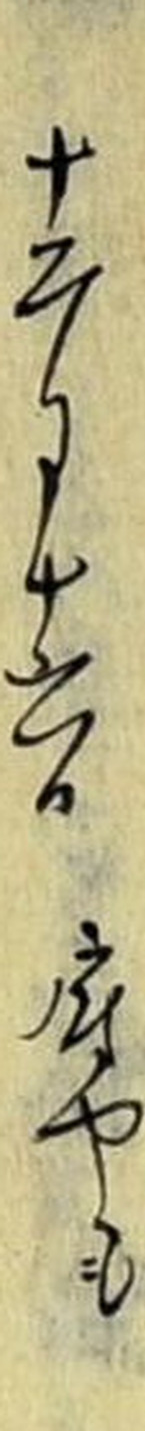十二月十六日府中へも
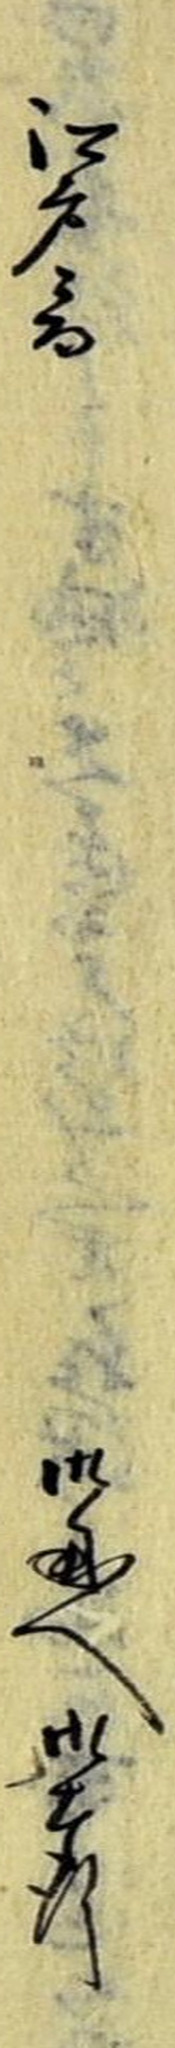江戸ニ而御用人御奉行

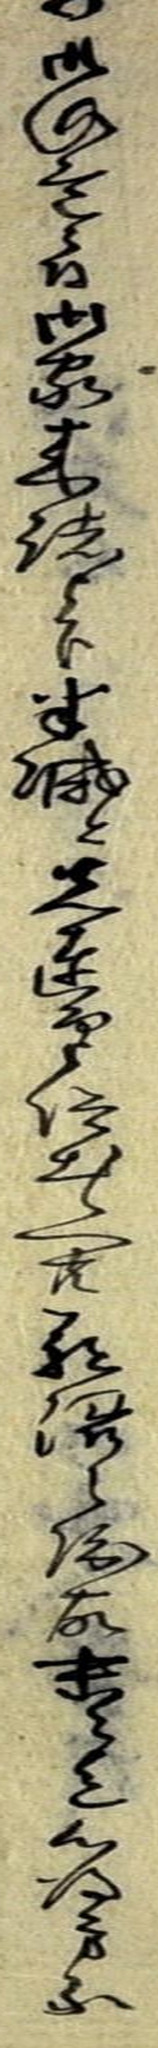〇御趣意ニ付御家来諸被下半減と先達而被仰出候へ共難渋之儀故末々迄心得方不
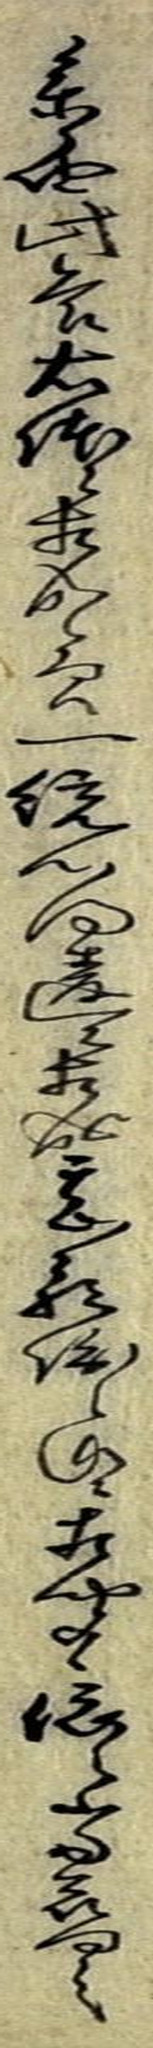参届此節右体ニ相成候而ハ一統心得違ニ相成甚難儀之趣ニ相聞候依之当暮之
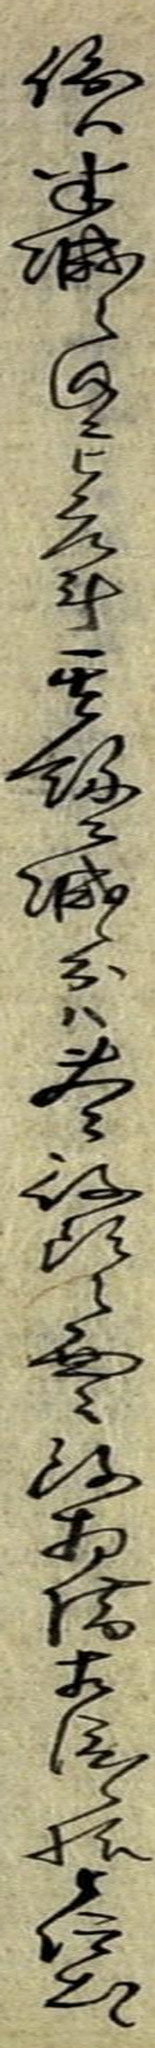儀ハ半減之趣ニ被取計其余ニ減候分ハ夫々役頭之面々致拝借相渡候様被仰出候
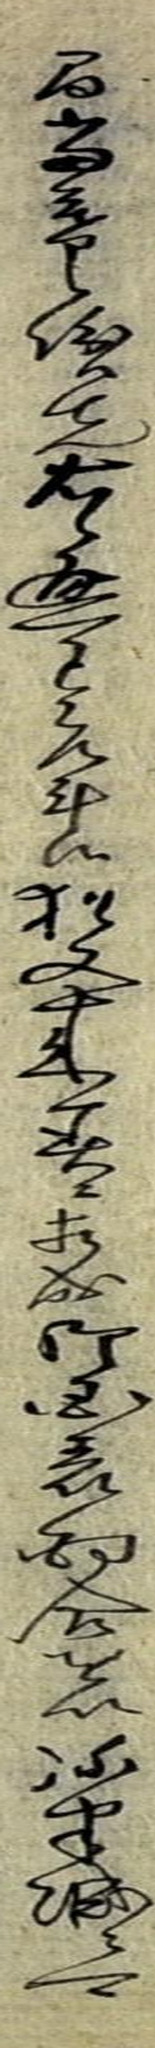間当暮之儀ハ先右之通可被取計候猶又来春ニ相成御国表釣合を以弥半減ニ可
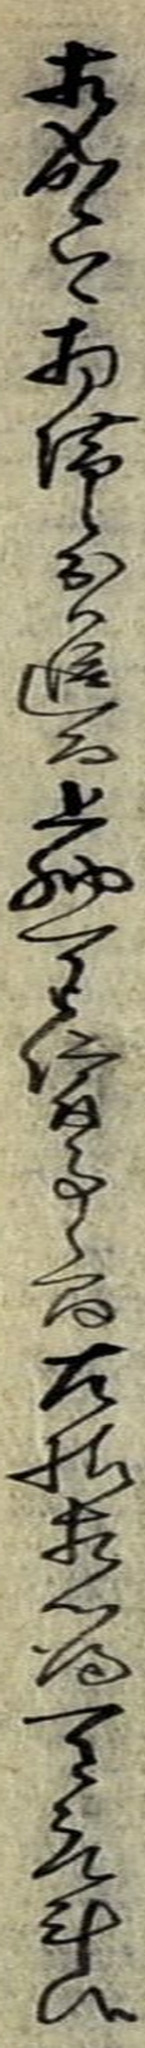相成候ハヽ拝借之分ハ追而上納可被仰付事候間左様相心得可被取計候
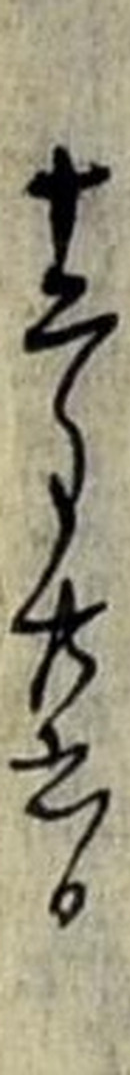十二月廿六日
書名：命令之部 三
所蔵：福井県文書館 Fukui Prefectural Archives
